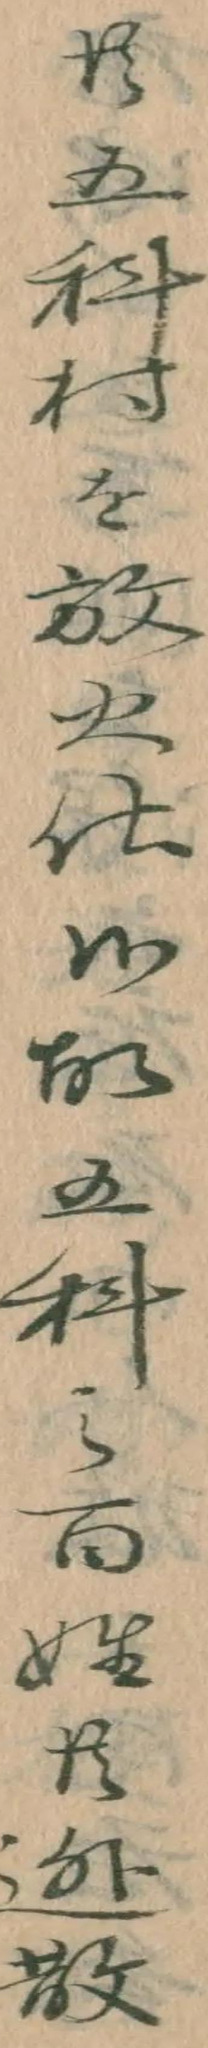共五科村を放火仕候故五科之百姓共逃散
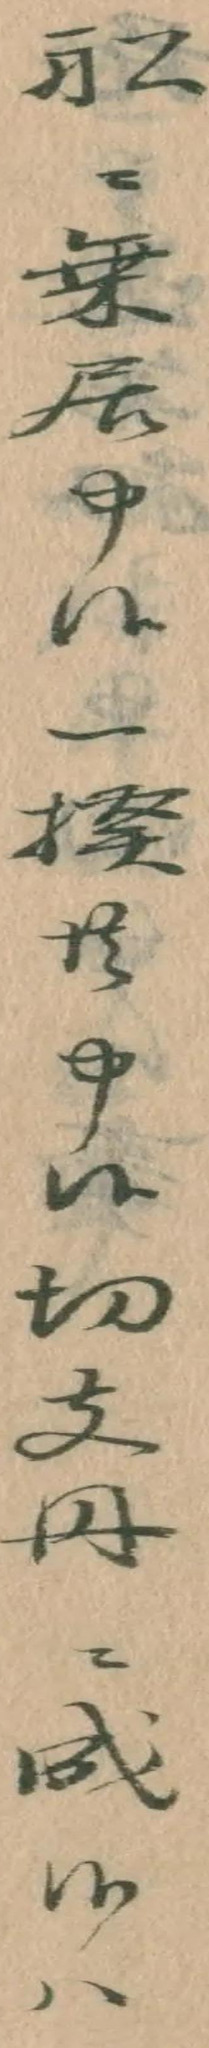船に乗居申候一揆共申候切支丹に成候は
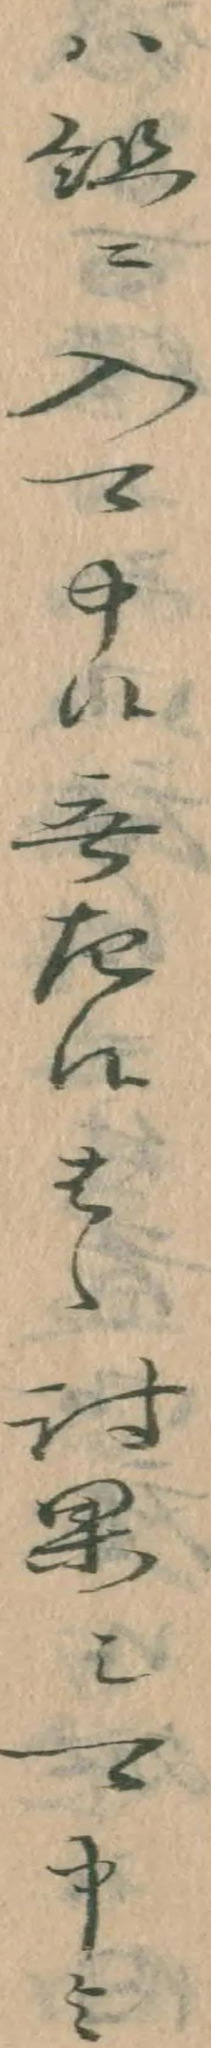は組に入可申候無左候はゝ討果し可申と
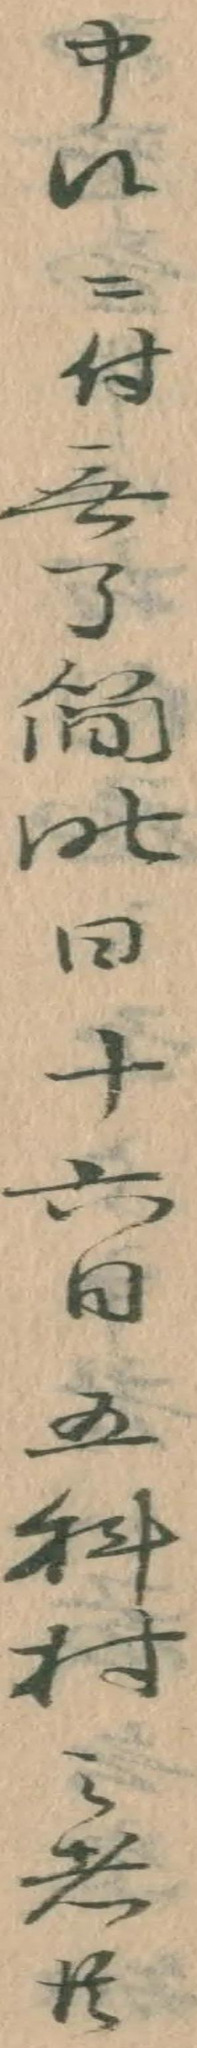申候に付無了簡昨日十六日五科村之者共
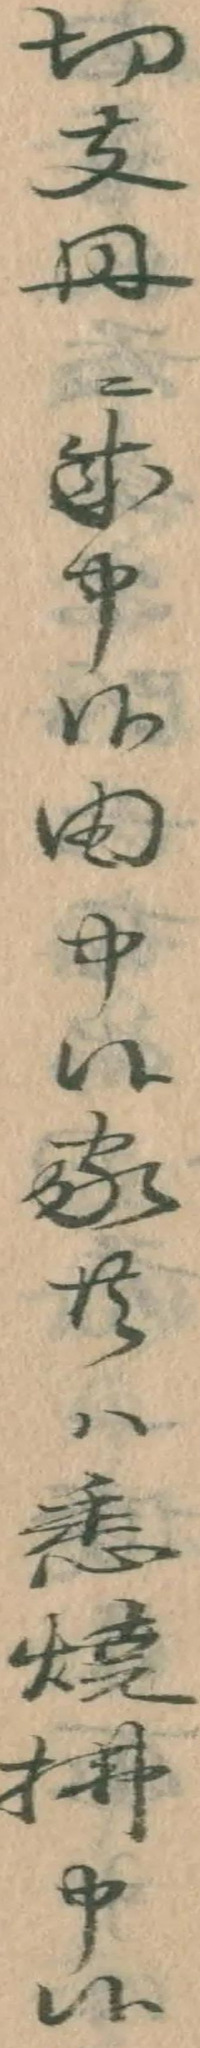切支丹に成申候由申候家共は悉焼払申候
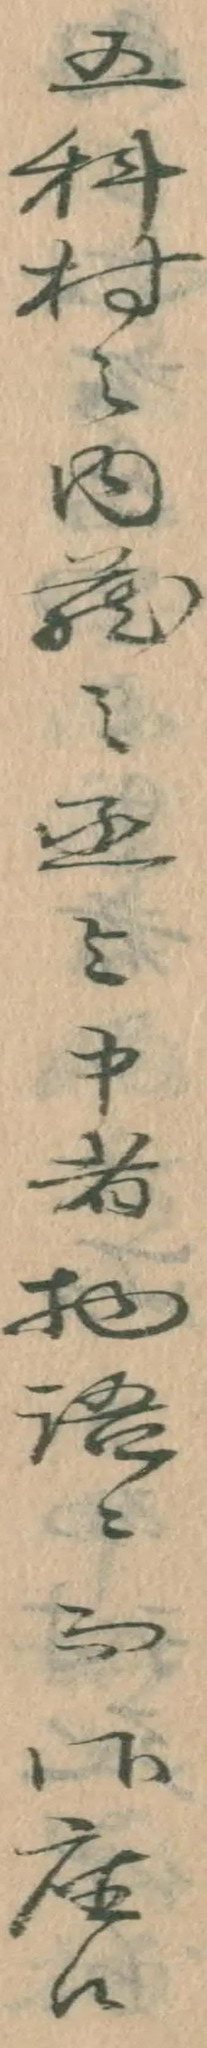五科村之内蔵之丞と申者物語に而御座候
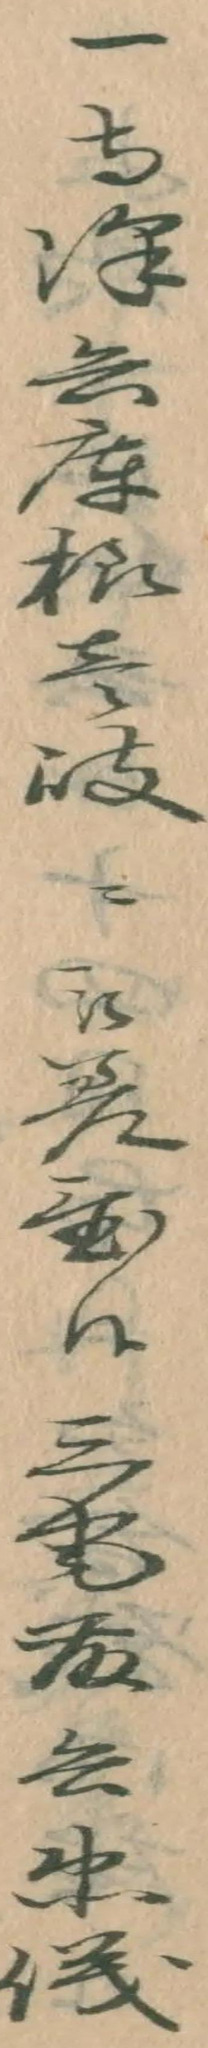一寺沢兵庫様壱岐に被差置候三宅藤兵衛儀

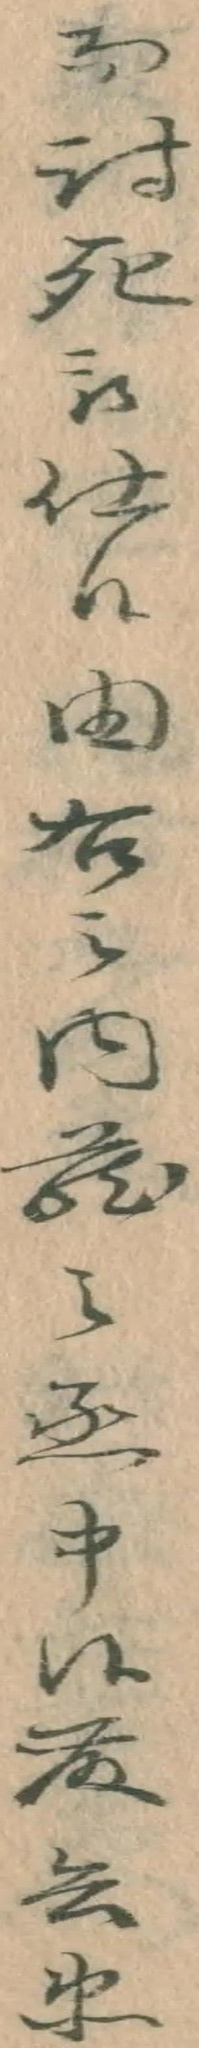而討死被仕候由右之内蔵之丞申候藤兵衛
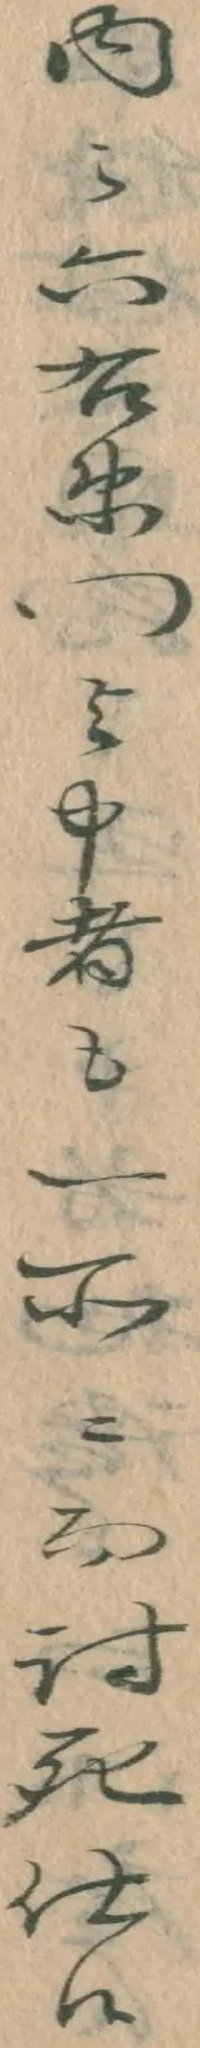内之六右衛門と申者も一所に而討死仕候
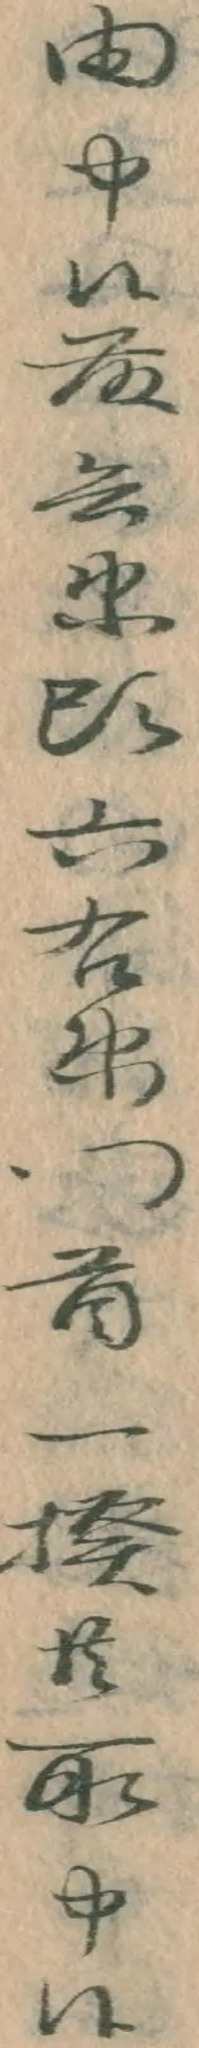由申候藤兵衛頭六右衛門首一揆共取申候
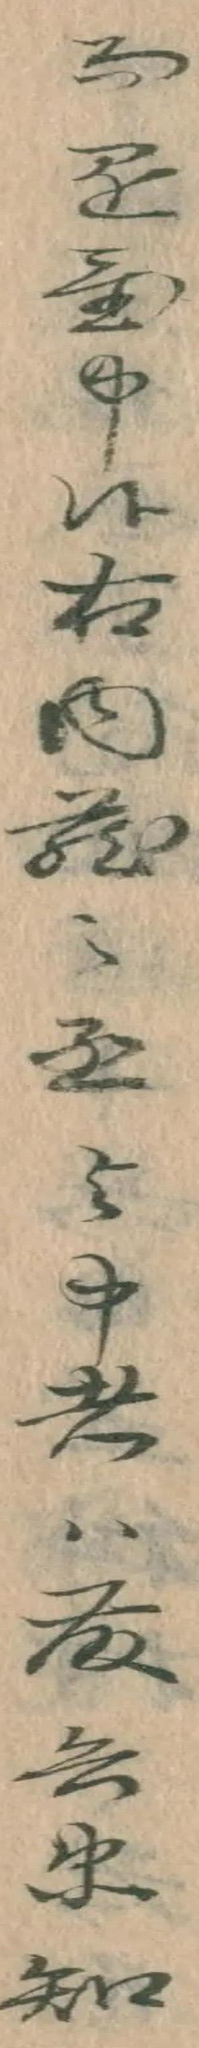而懸置申候右内蔵之丞と申者は藤兵衛知
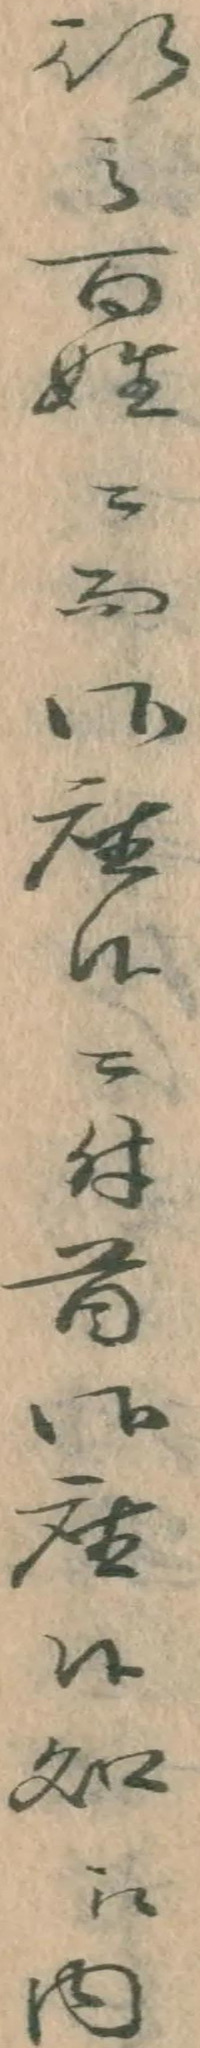行之百姓に而御座候に付首御座候処江内
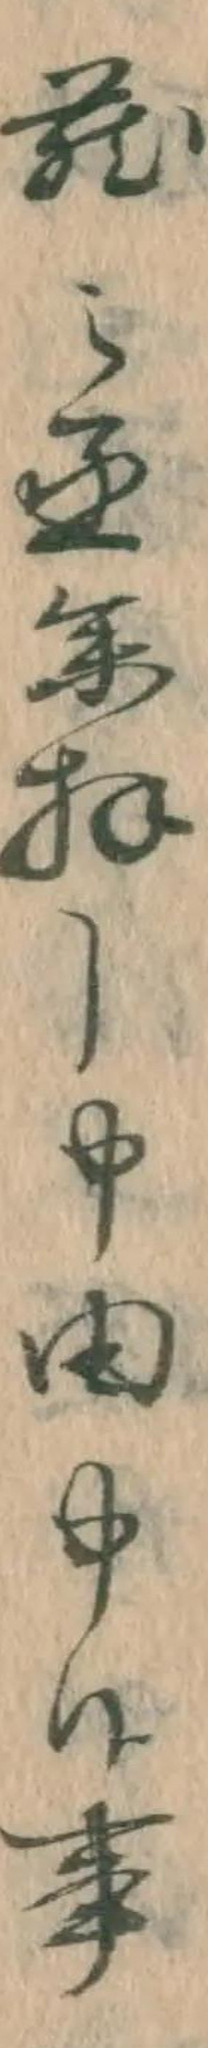蔵之丞参拝し申由申候事
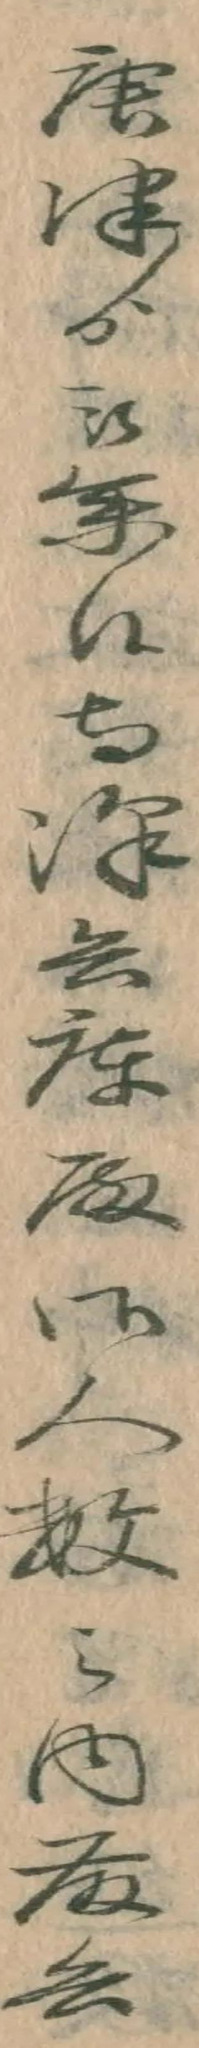一唐津ゟ被参候寺沢兵庫殿御人数之内藤兵
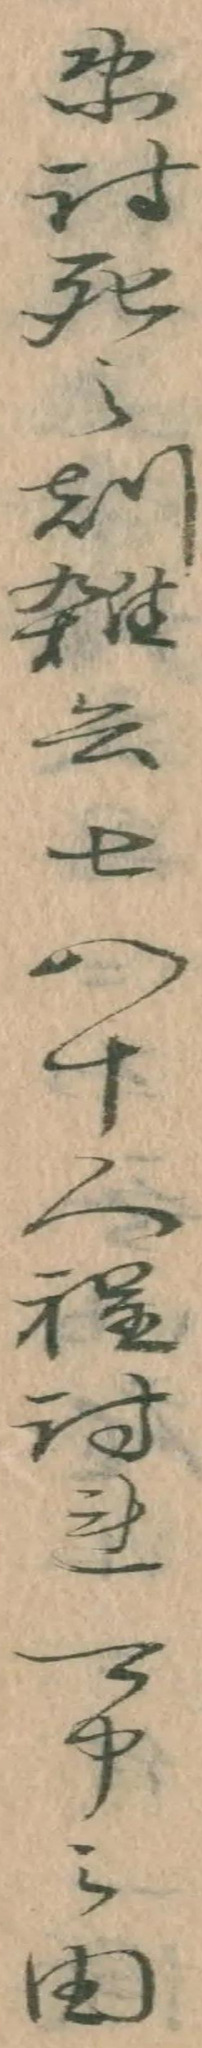衛討死之刻雑兵七八十人程討れ可申之由
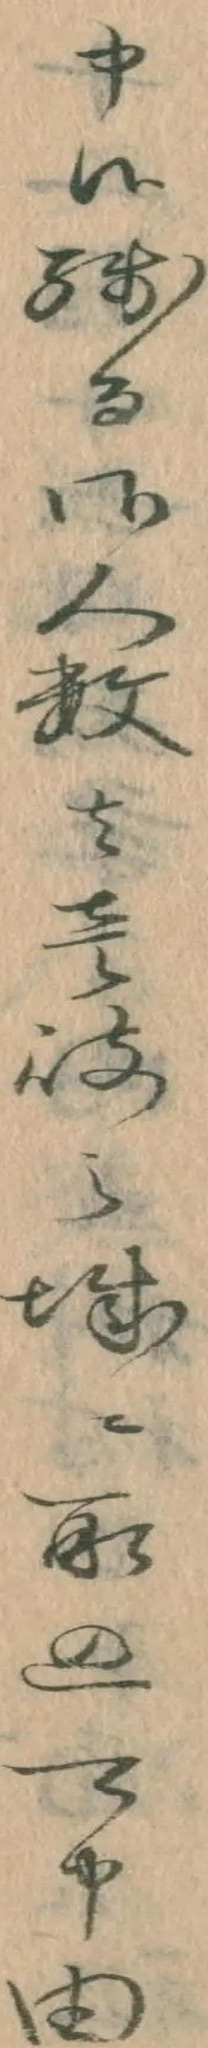申候残る御人数は壱岐之城に取込可申由
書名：切支丹御退治記 49巻. [3]
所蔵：国立国会図書館 National Diet Library, JAPAN
